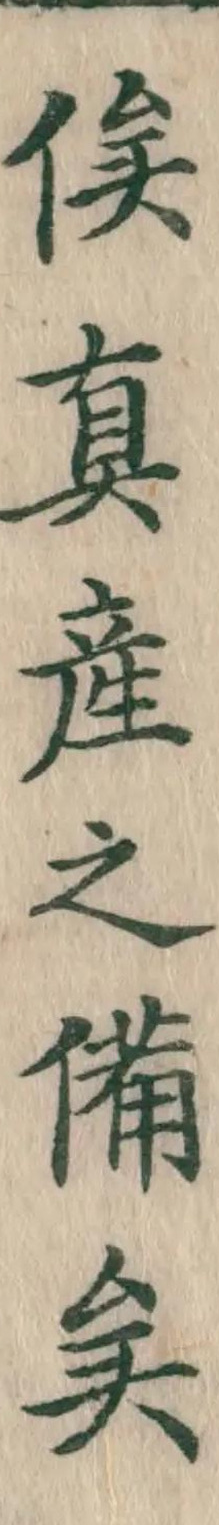俟真産之備矣
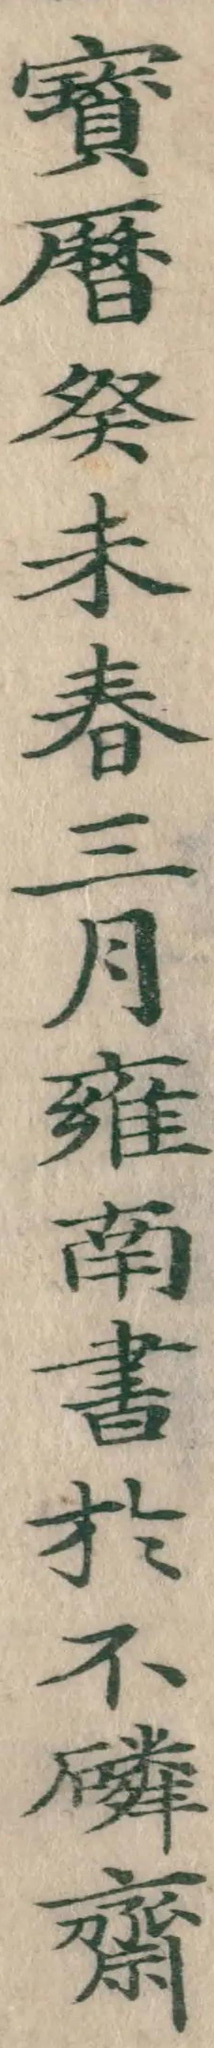宝暦癸未春三月雍南書於不磷斎

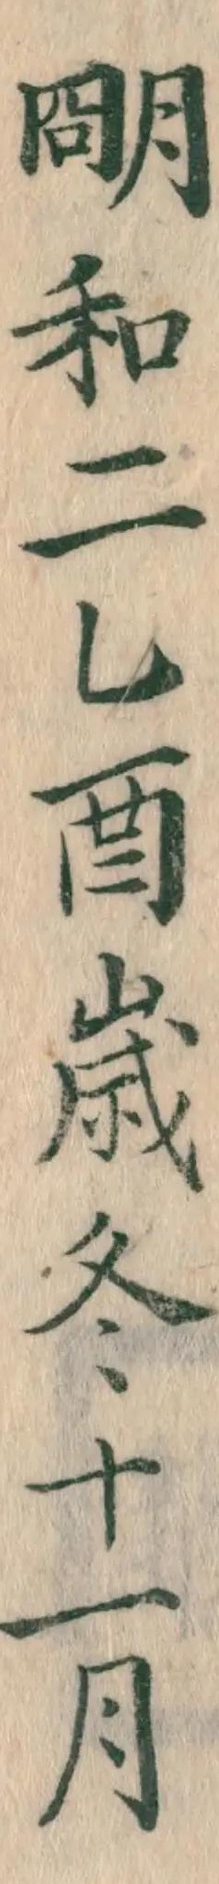明和二乙酉歳冬十一月
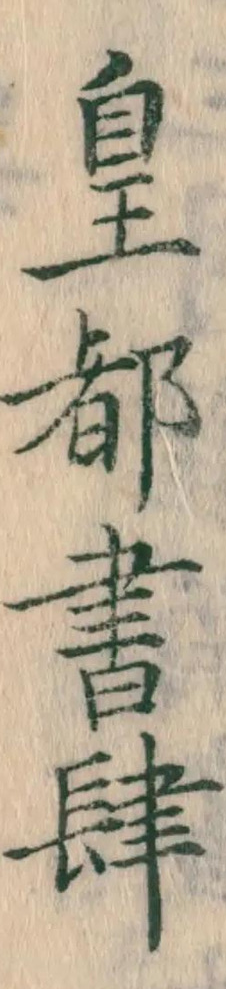皇都書肆
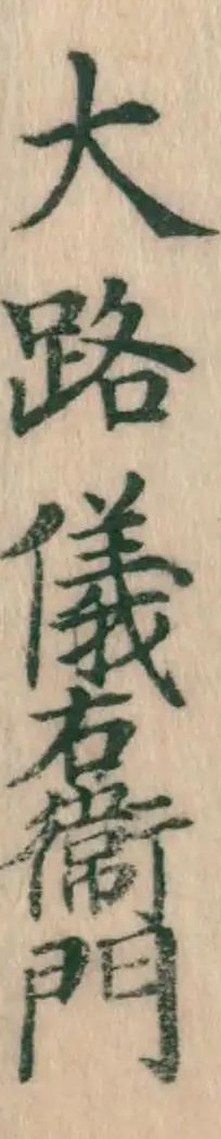大路儀右衛門
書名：花彙 草部4巻木部4巻. [2]
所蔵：国立国会図書館 National Diet Library, JAPAN
